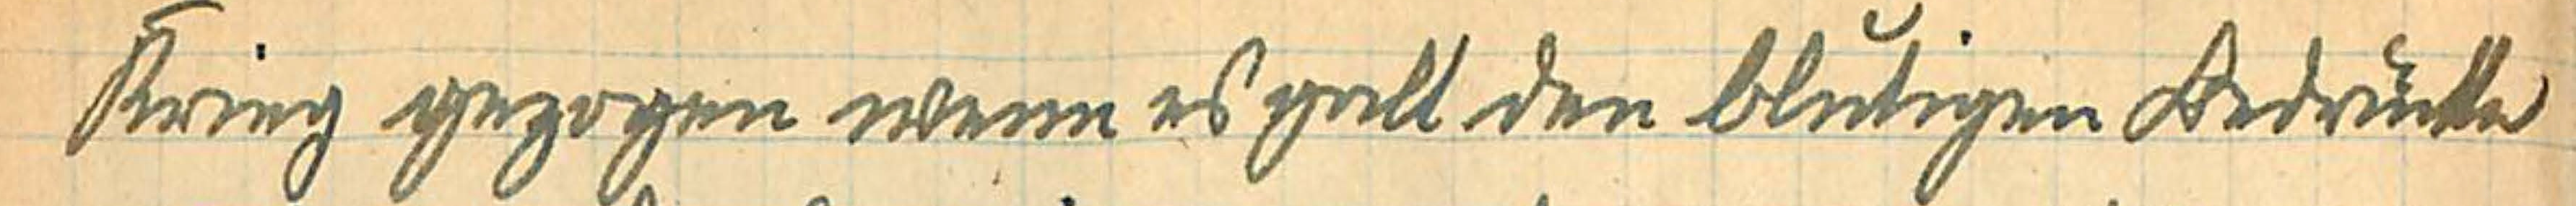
Krieg gezogen wenn es galt den blutigen Bedrücker
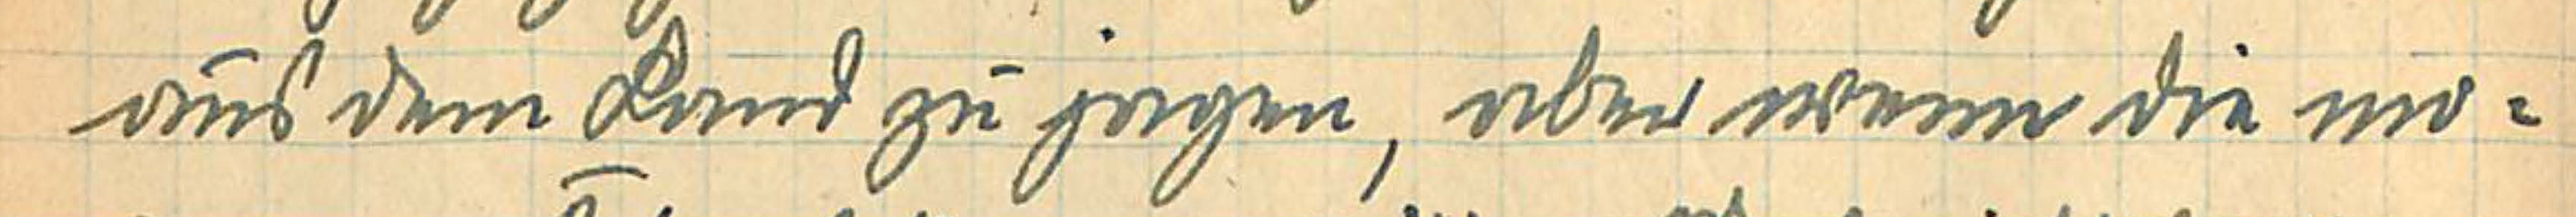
aus dem Land zu jagen, aber wenn die mo-
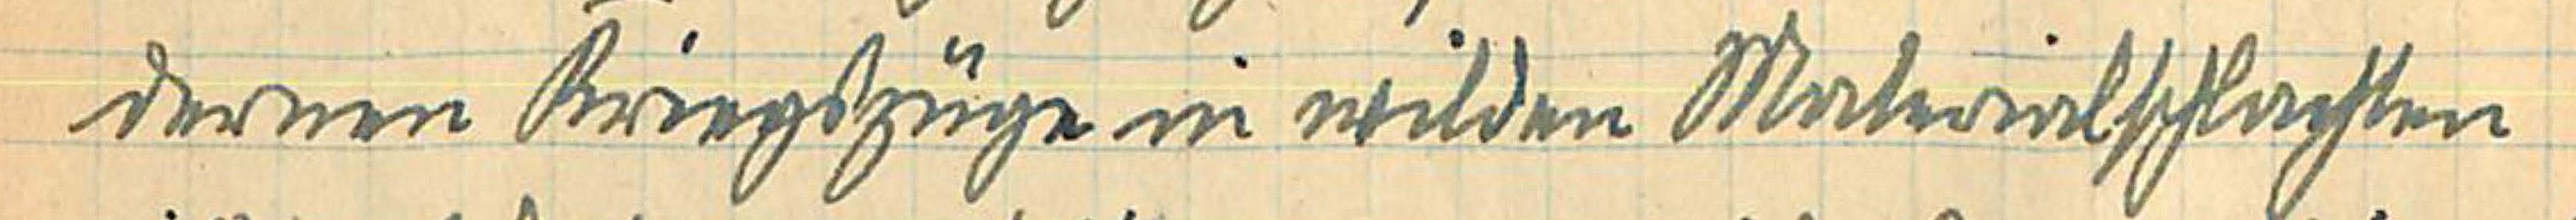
dernen Kriegszüge in wilden Materialschlachten
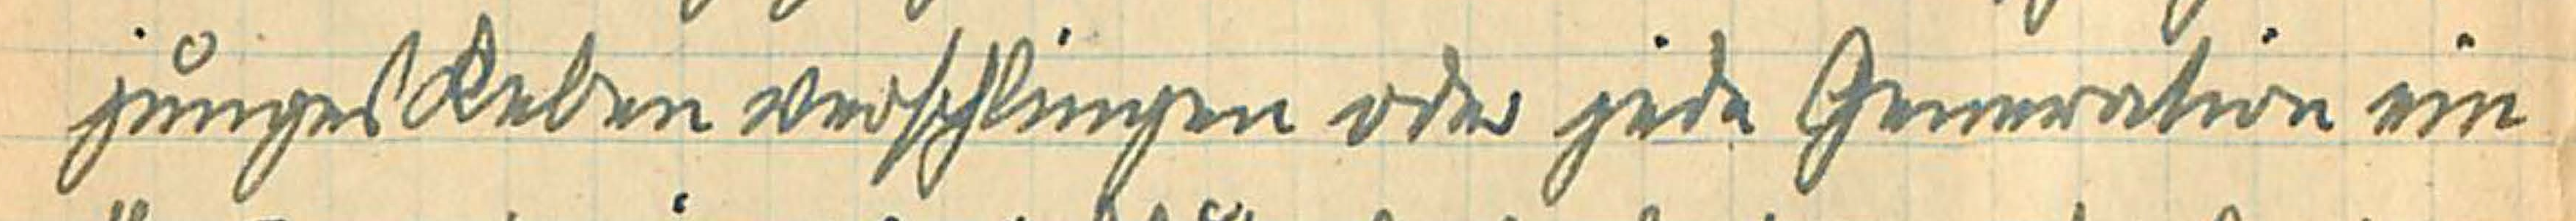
junges Leben verschlingen oder jede Generation ein
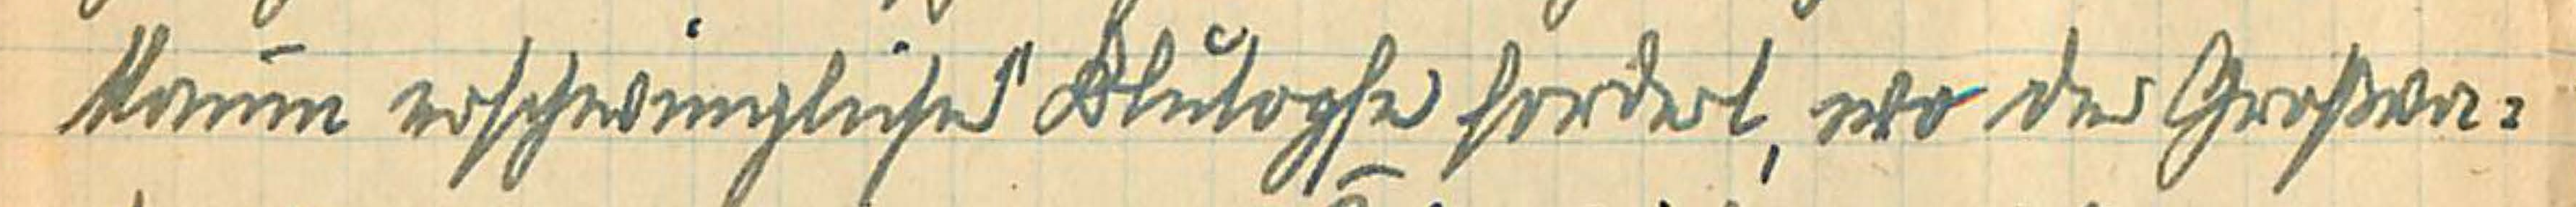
kaum erschwingliche Blutopfer fordert, wo der Großva-
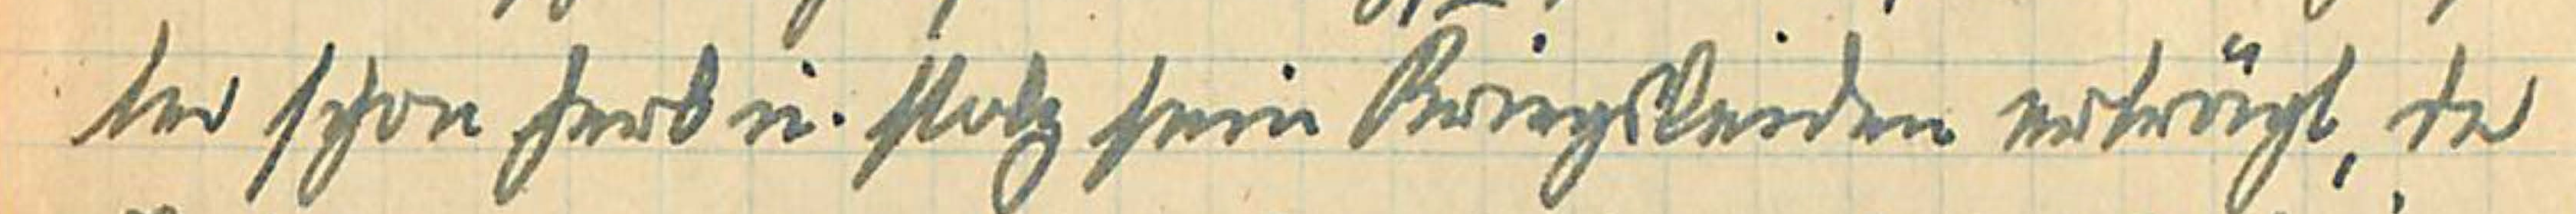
ter schon herb u. stolz sein Kriegsleiden erträgt, der
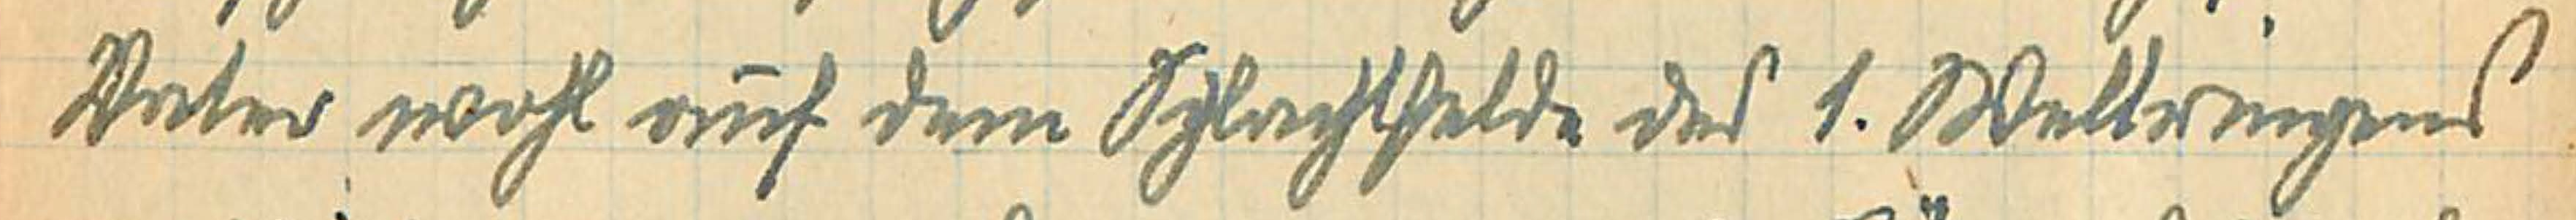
Vater wohl auf dem Schlachtfelde des 1. Weltringens
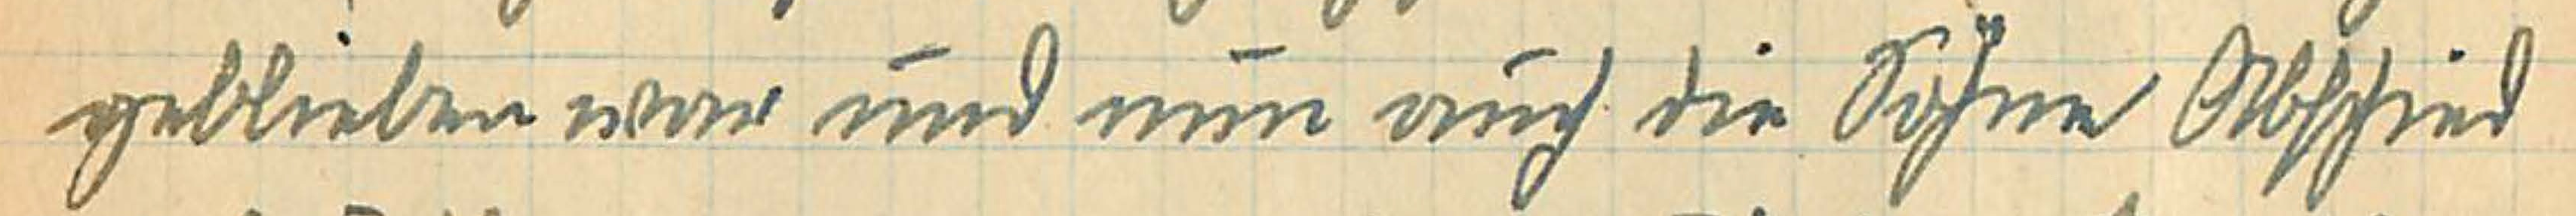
geblieben war und nun auch die Söhne Abschied
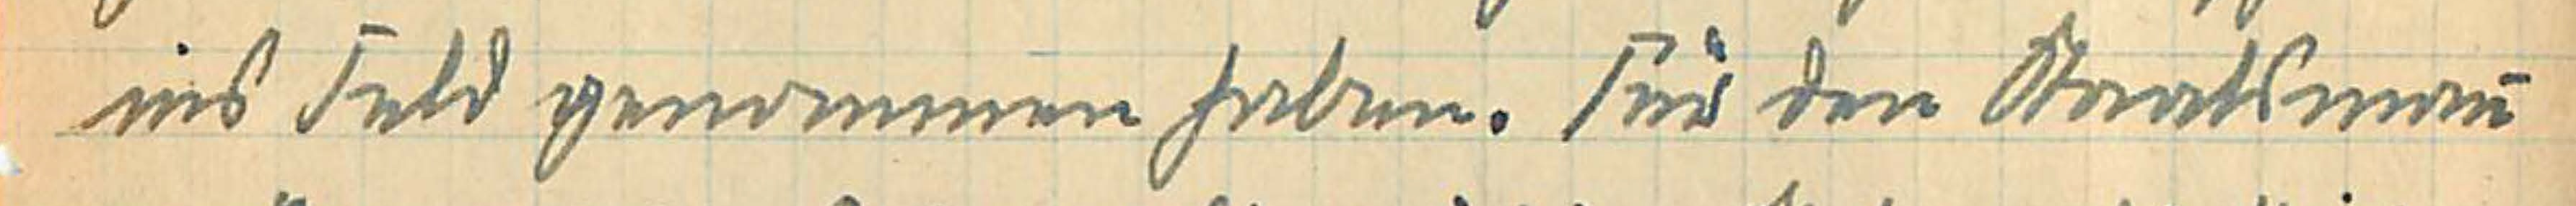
ins Feld genommen haben. Für den Staatsmann
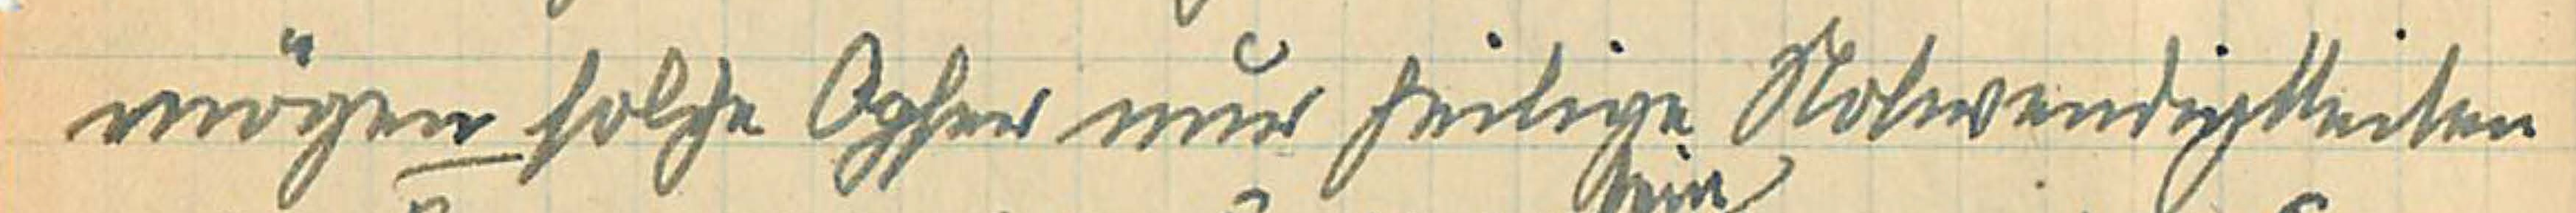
mögen solche Opfer nur heilige Notwendigkeiten
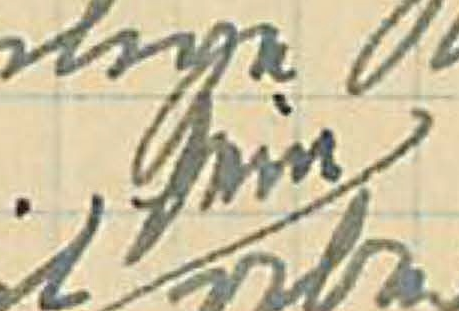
sein
